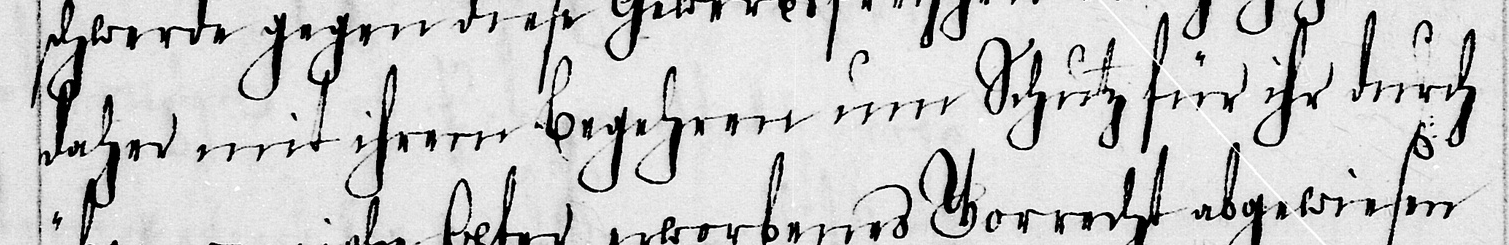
daher mit ihrem Begehren um Schutz für ihr durch
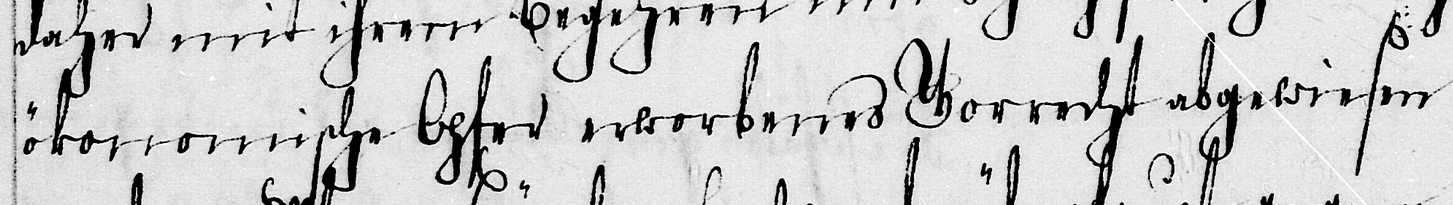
ökonomische Opfer erworbenes Vorrecht abgewiesen
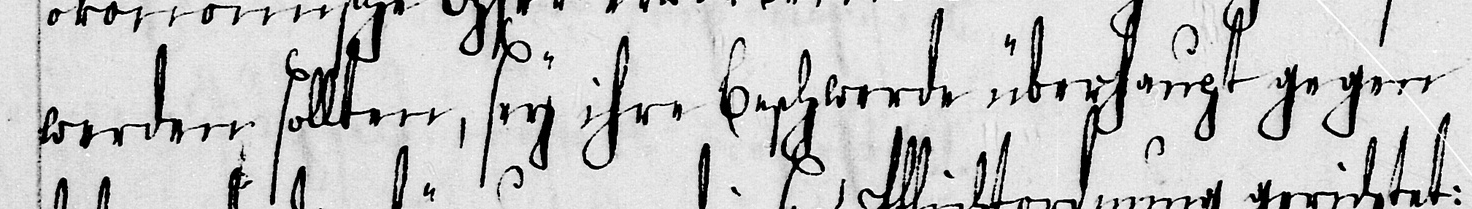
werden sollten, sey ihre Beschwerde überhaupt gegen
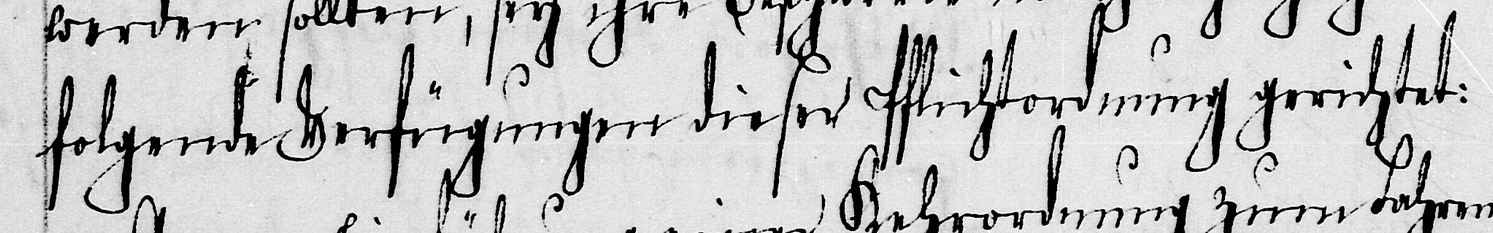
folgende Verfügungen dieser Pflichtordnung gerichte¬
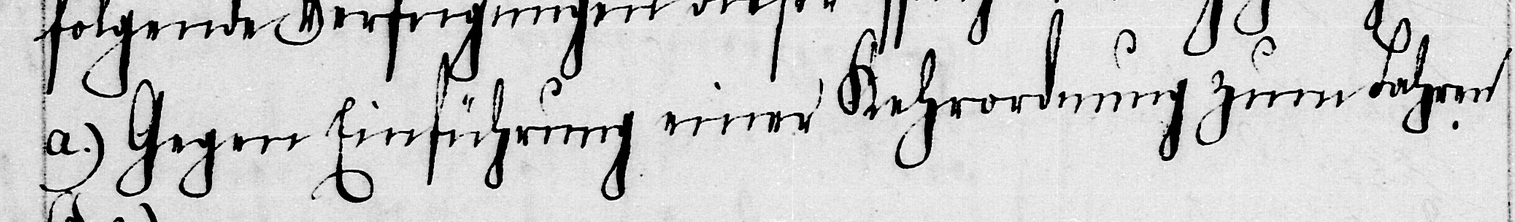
a.) Gegen Einführung einer Kehrordnung zum Fahren
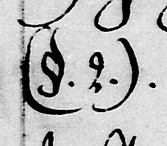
(§. 2.).
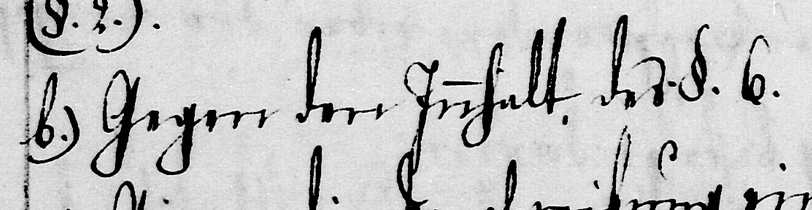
b.) Gegen den Innhalt des §. 6.
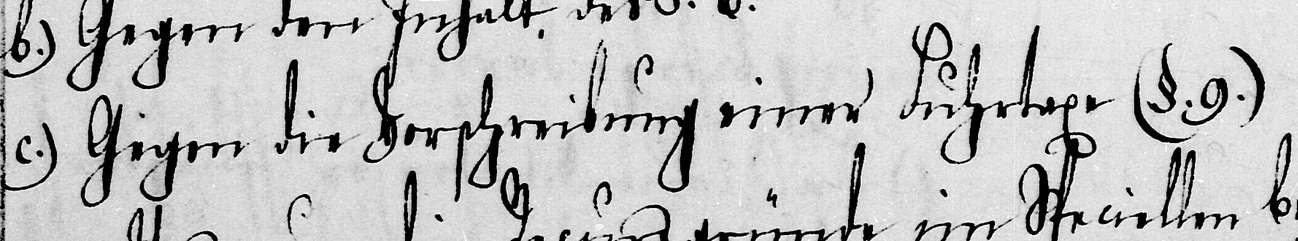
c.) Gegen die Vorschreibung einer Fuhrtaxe (§. 9.)
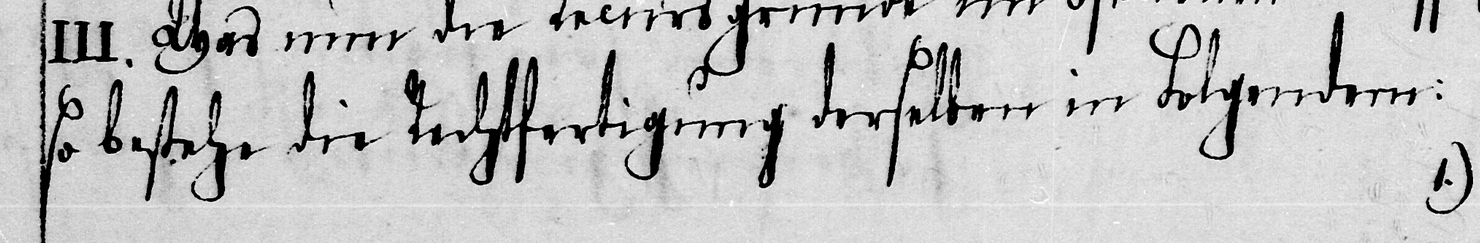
so bestehe die Rechtfertigung derselben in Folgendem:
